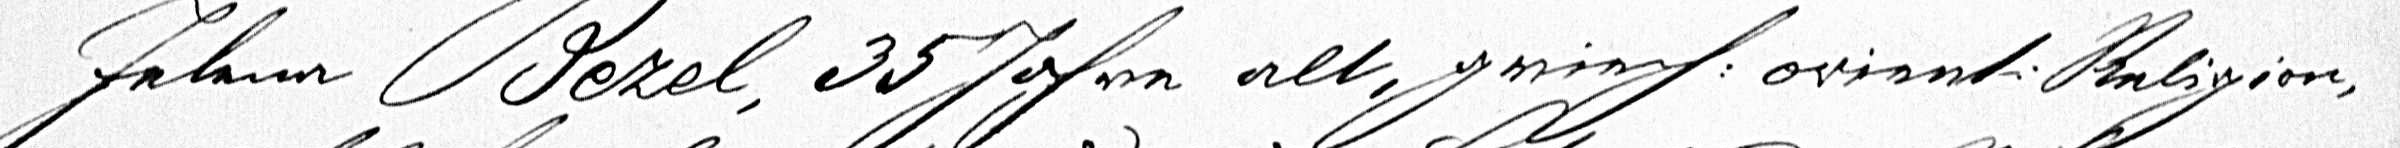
Jelena Bezel, 35 Jahre alt, griech. orient. Religion,
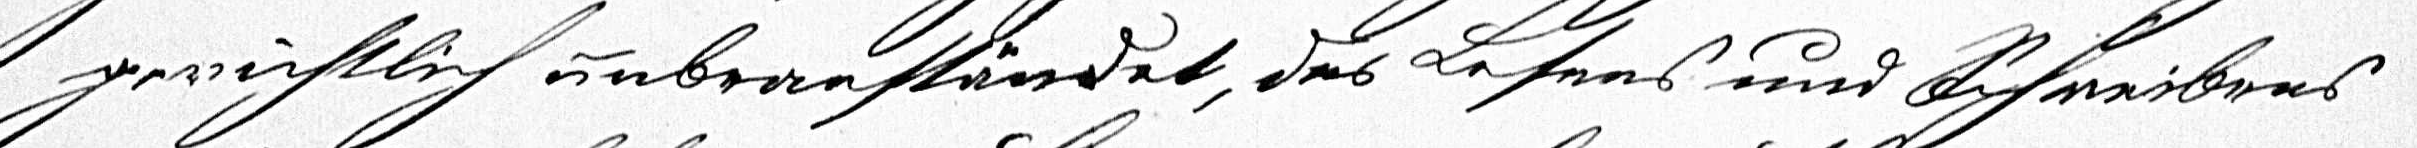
gerichtlich unbeanständet, des Lesens und Schreibens
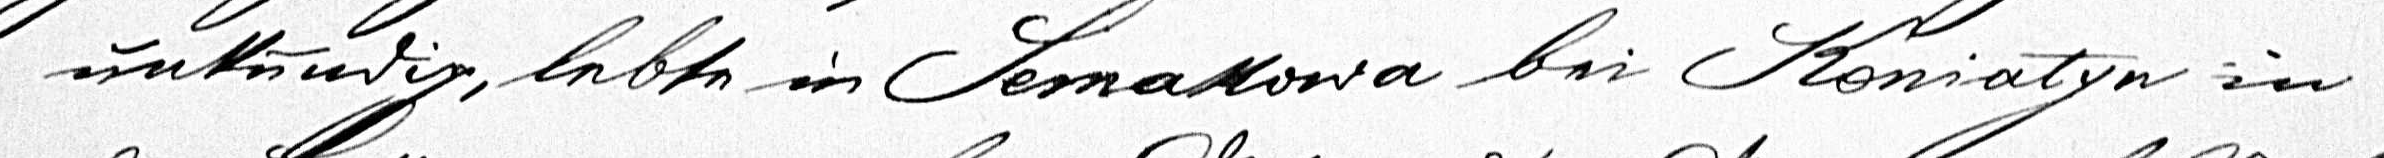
unkundig, lebte in Semakowa bei Koniatyn in
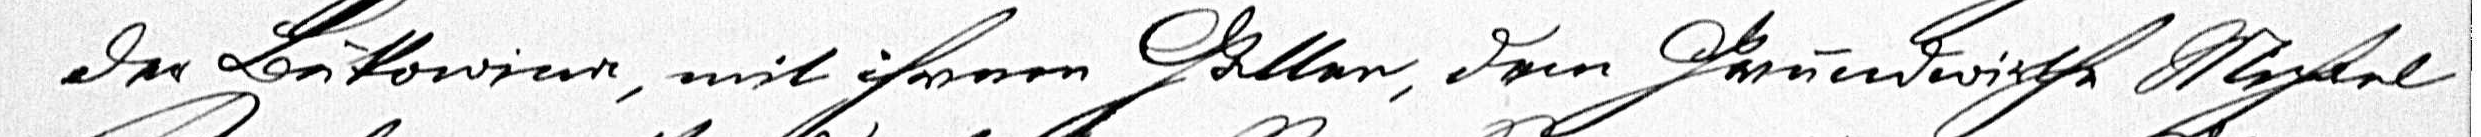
der Bukowina, mit ihrem Gatten, dem Grundwirthe Michael
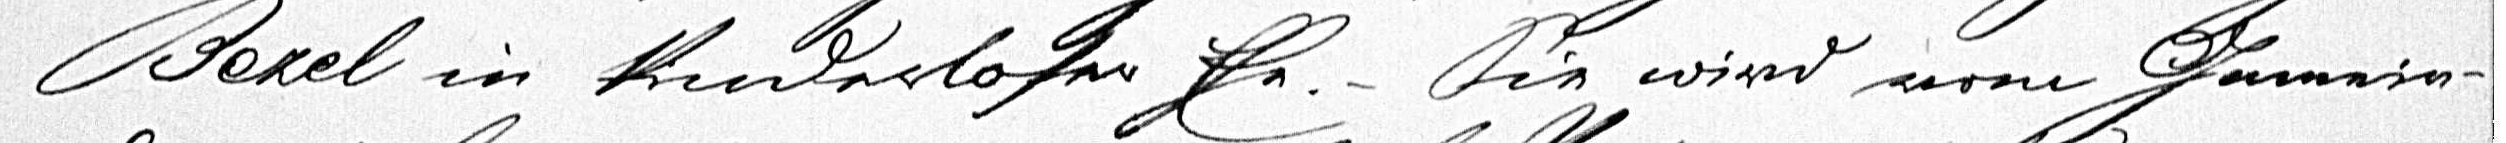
Bezel in kinderloser Ehe. Sie wird vom Gemein¬
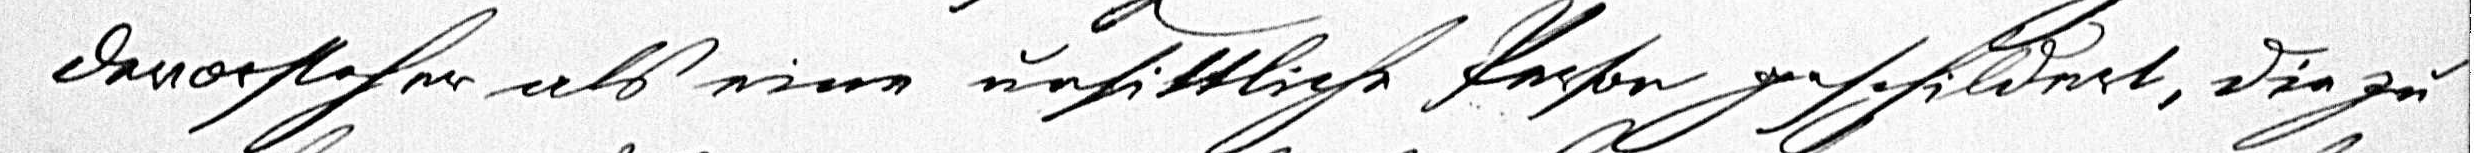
devorsteher als eine unsittliche Person geschildert, die zu
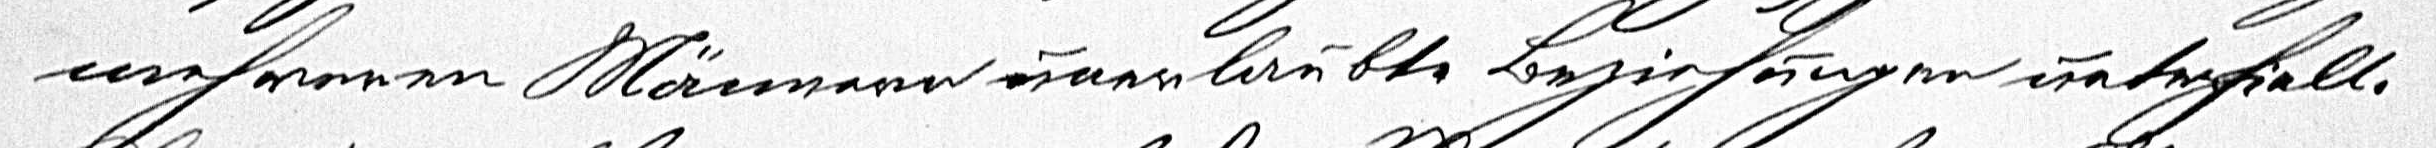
mehreren Männdern unerlaubte Beziehungen unterhielt.
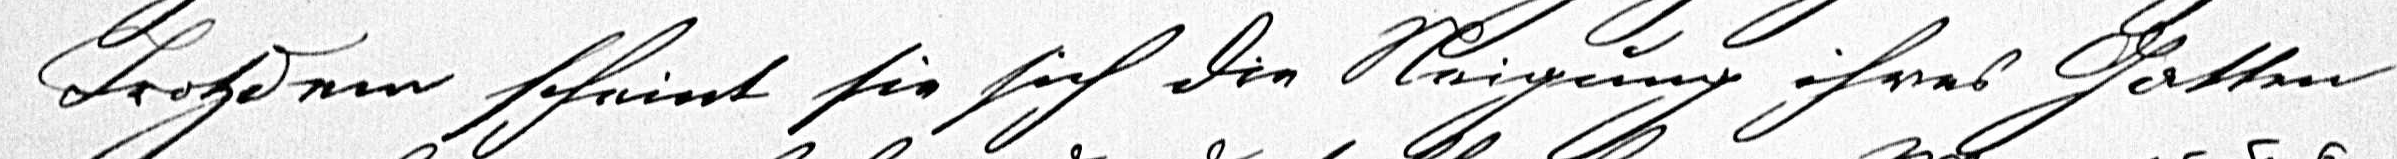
Trotzdem scheint sie sich die Neigung ihres Gatten
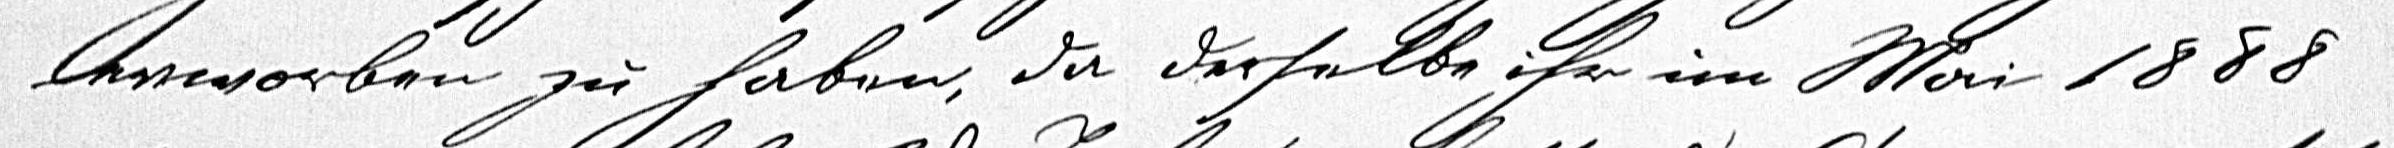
erworben zu haben, da derselbe ihr im Mai 1888
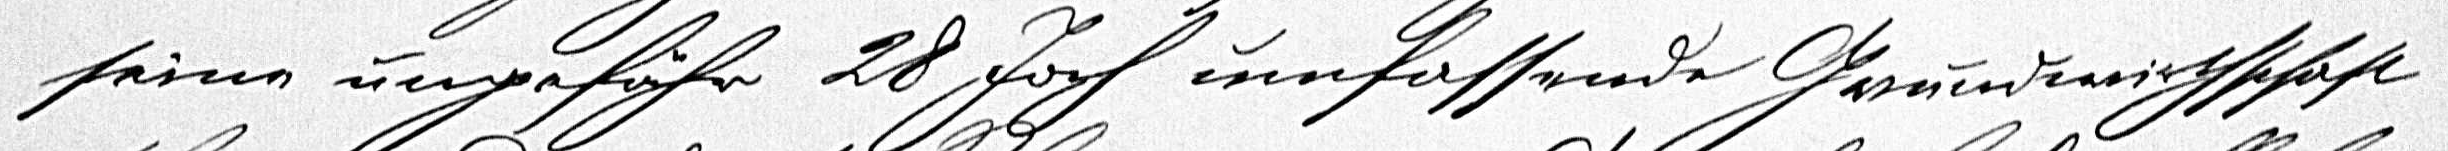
seine ungefähr 28 Joch umfassende Grundwirtschaft
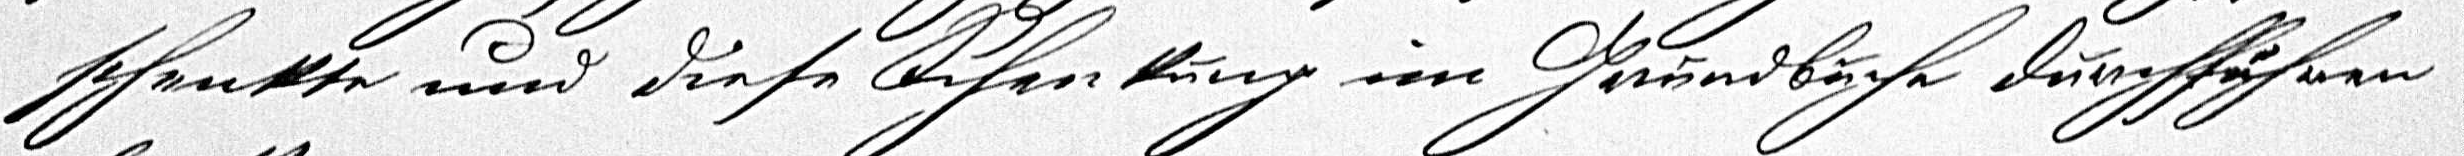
schenkte und diese Schenkung im Grundbuche durchführen
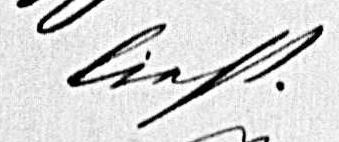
ließ.
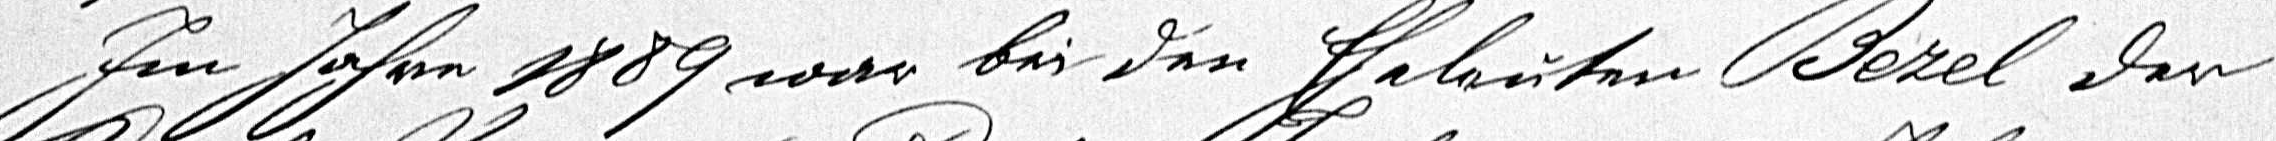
Im Jahre 1889 war bei den Eheleuten Bezel der
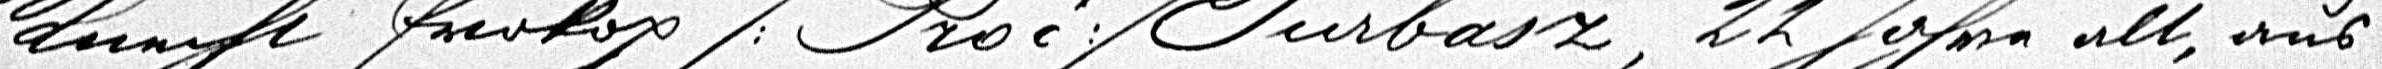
Knecht Prokop (Proć) Iurbasz, 22 Jahre alt, aus
